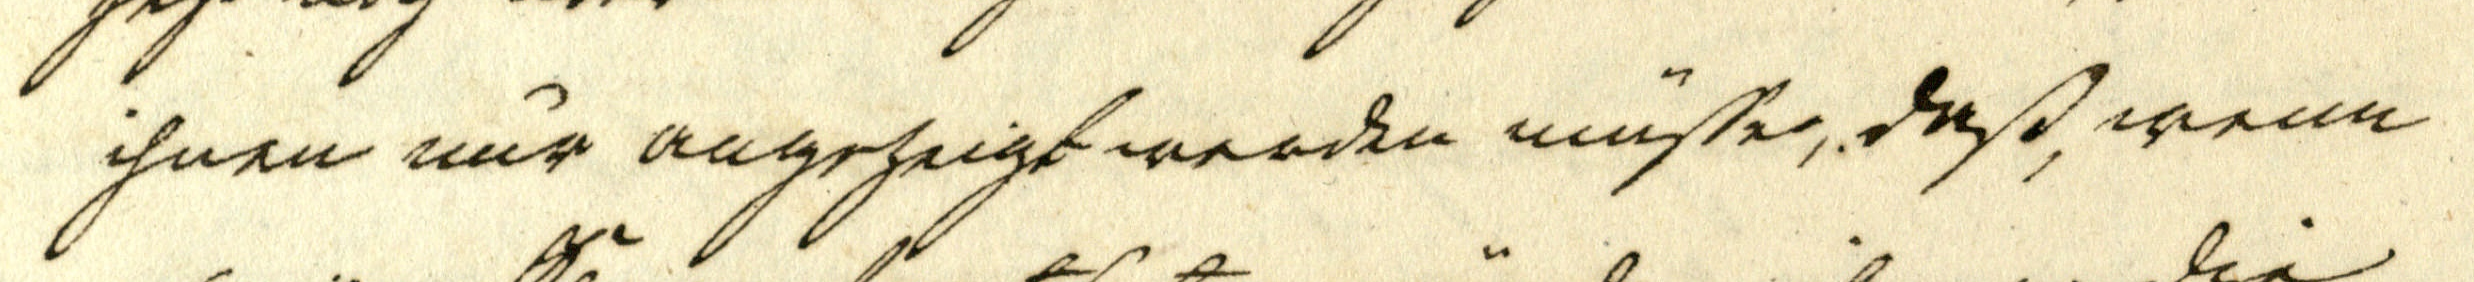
ihnen nur angezeigt werden müsse, daß wenn
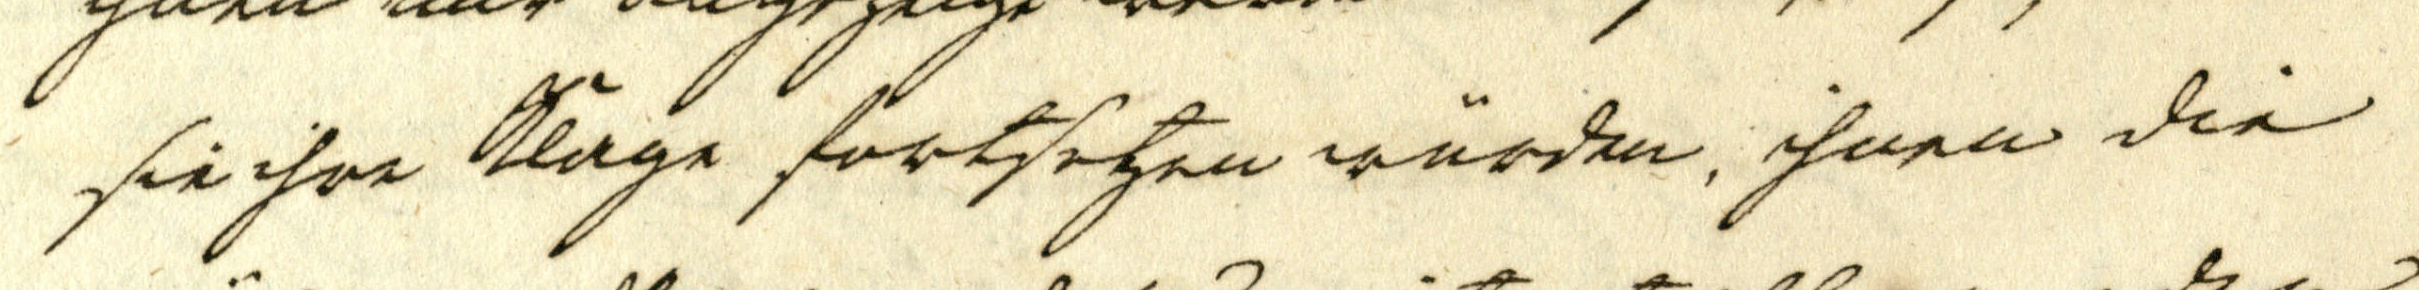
sie ihre Klage fortsetzen würden, ihnen die
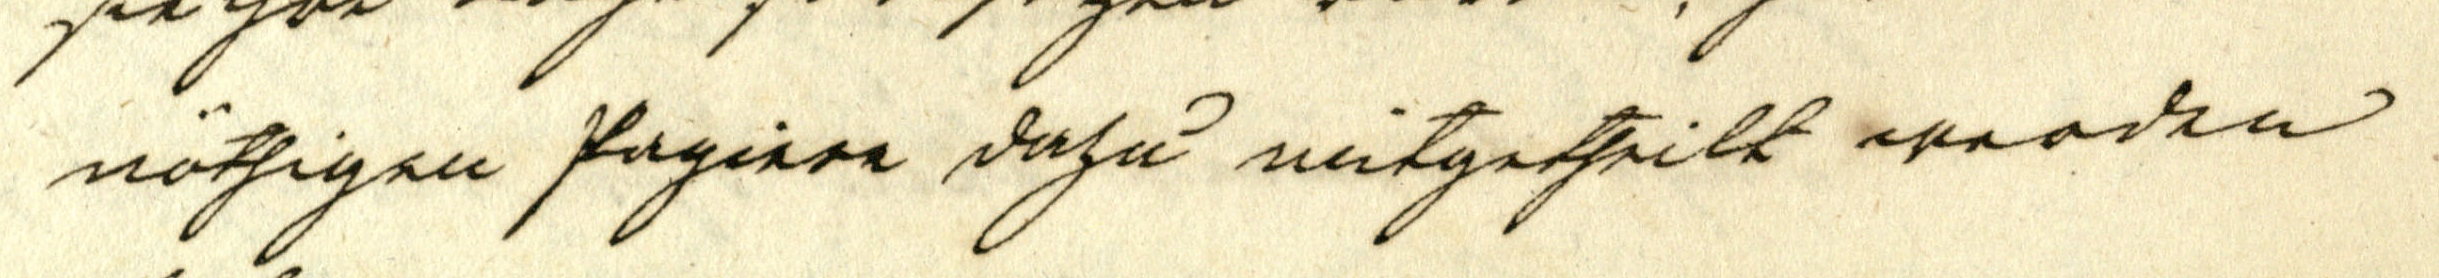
nöthigen Papiere dazu mitgetheilt werden
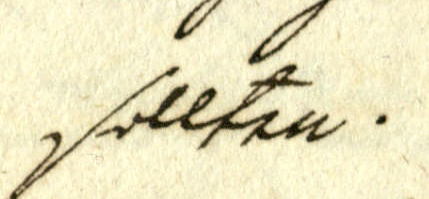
sollten.
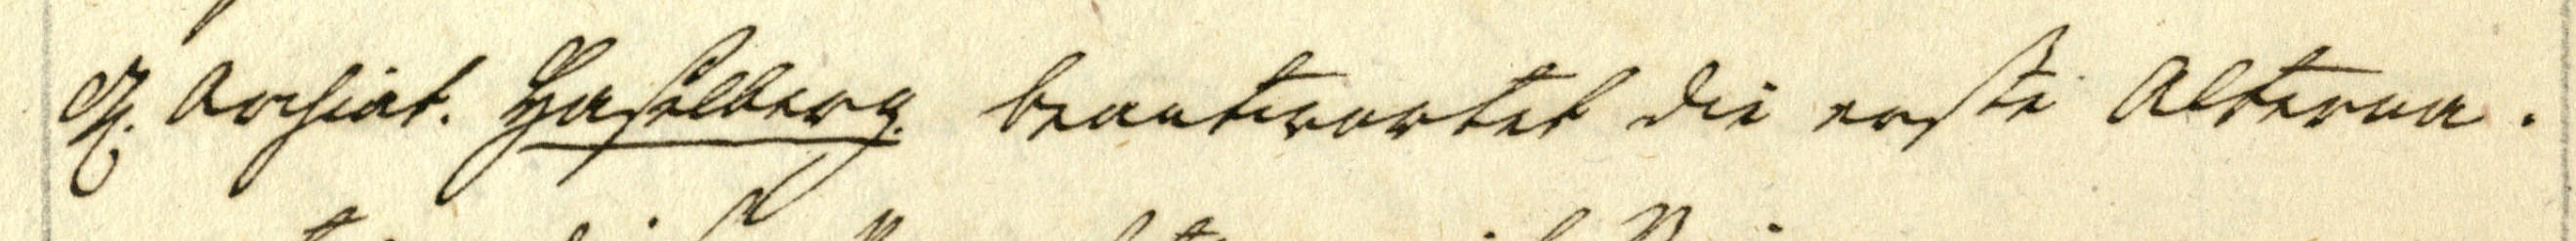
dh. Archiat. Haselberg beantwortet die erste Alterna¬
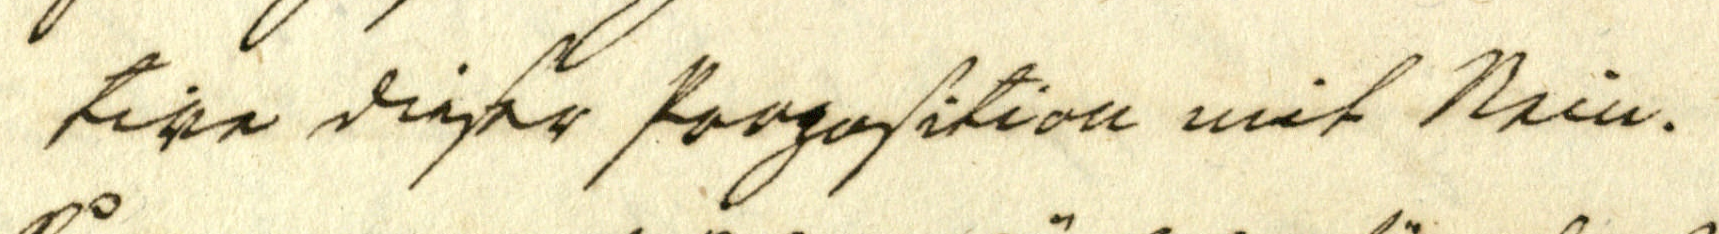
tive dieser Proposition mit Nein.
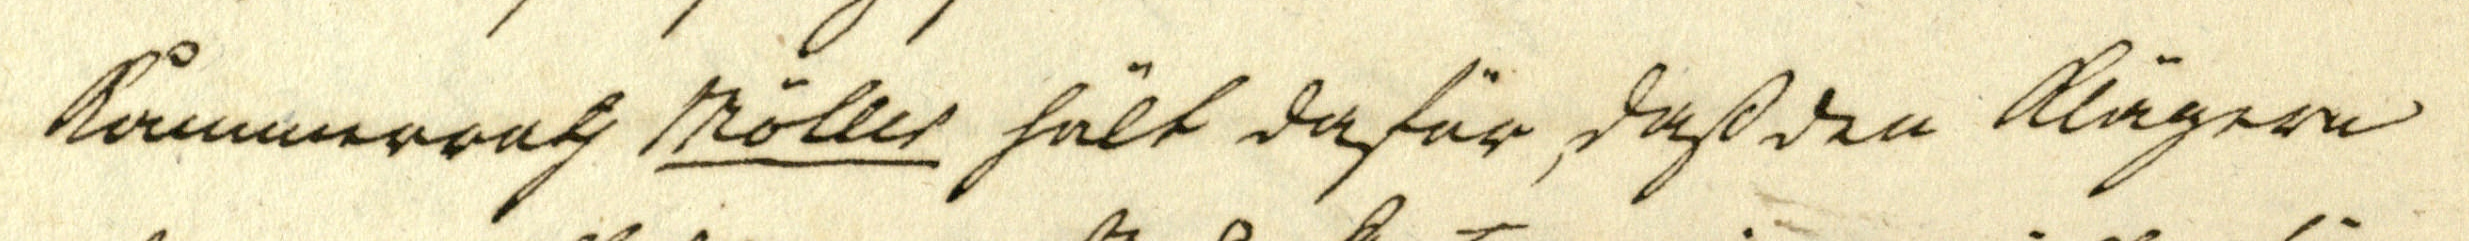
Kamerrath Möller hält dafür, daß den Klägern
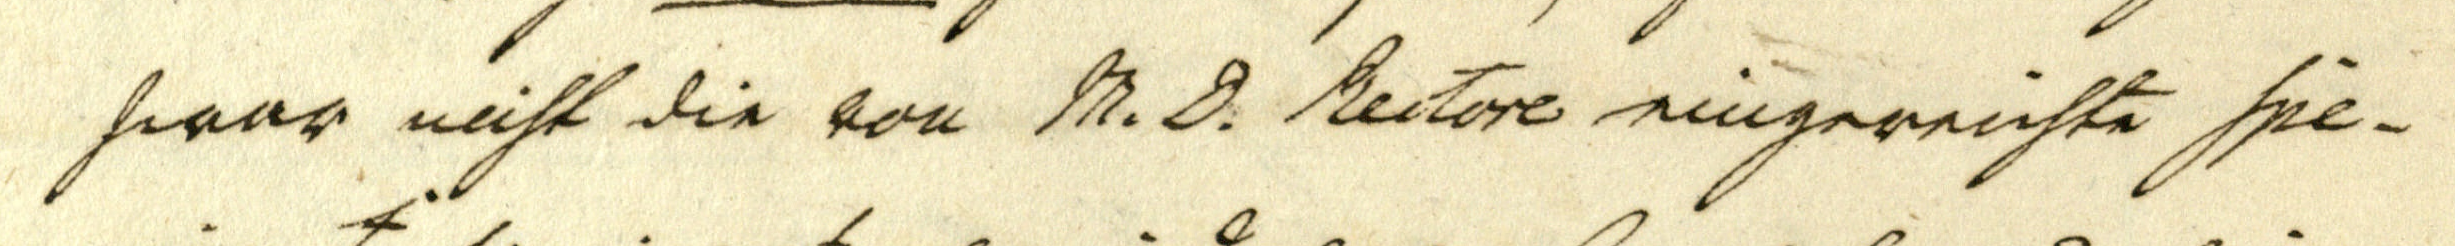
zwar nicht die von M. D. Rectore eingereichte Spe¬
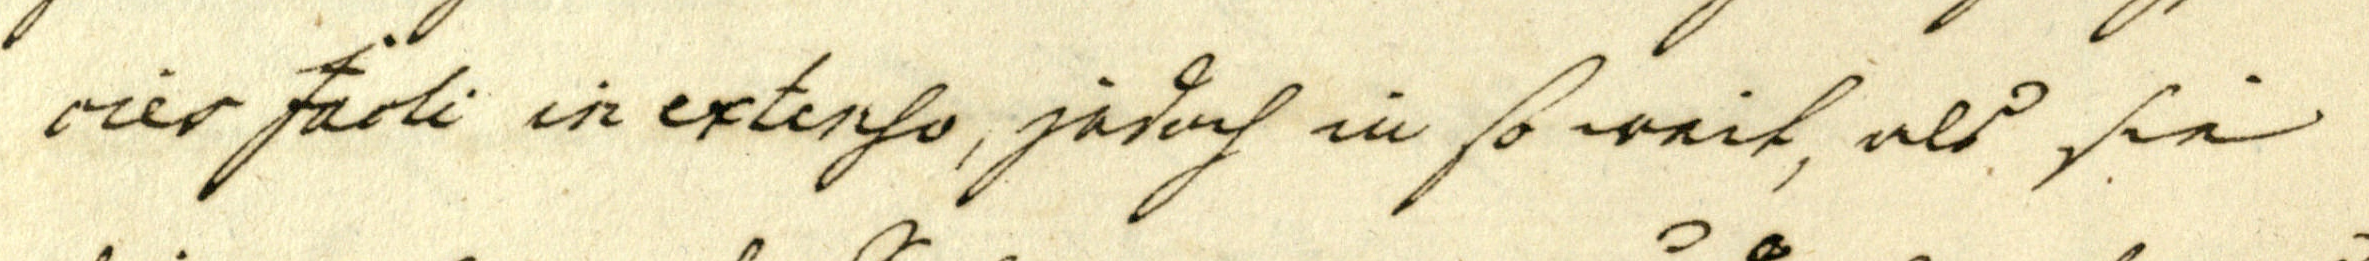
cies Facti in extenso, jedoch in so weit, als sie
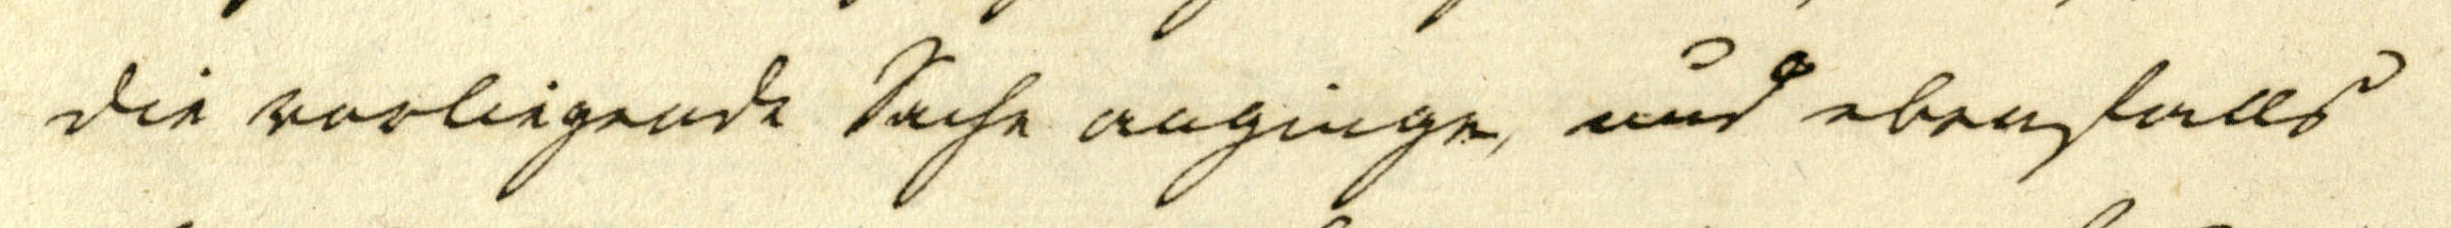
die vorliegende Sache anginge, und ebenfalls
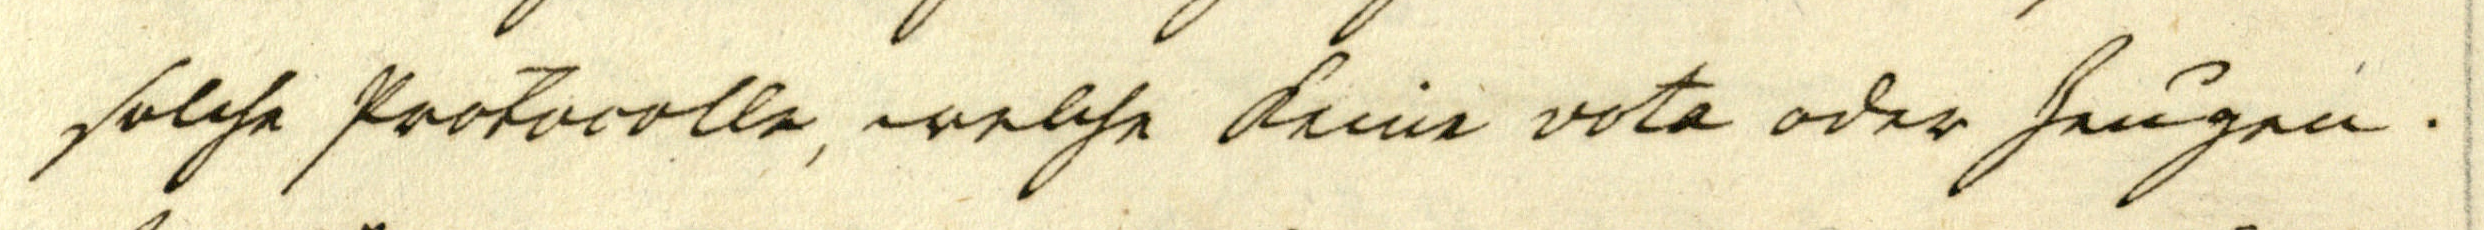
solche Protocolle, welche keine vota oder Zeugen¬
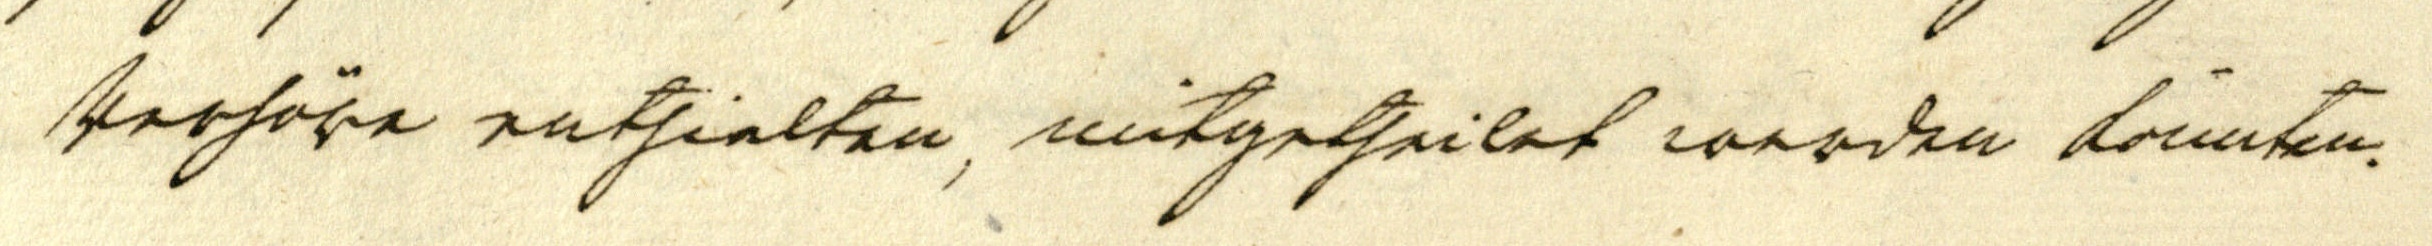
Verhöre enthielten, mitgetheilet werden könnten.
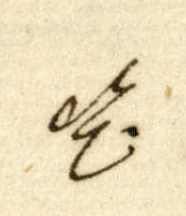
dh.
